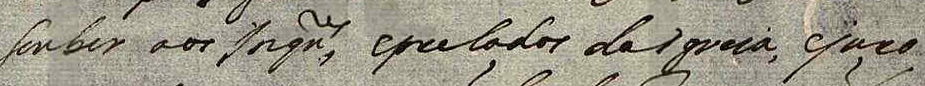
souber aos Inqures, e prelados da igreia, e juro
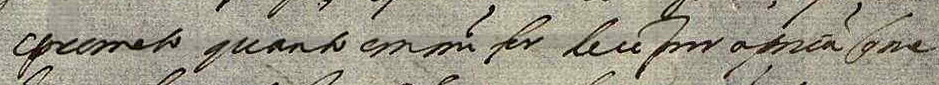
e prometo quanto em mī for de cōprir a pniā q̄ me
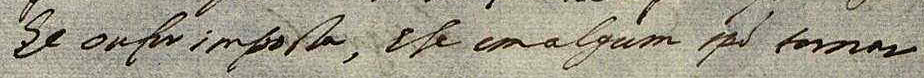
he ou for imposta, E se em algum tpō tornar
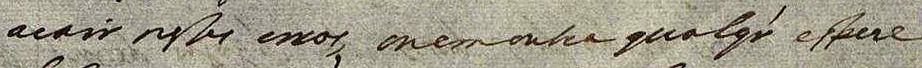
a cair nestes erros, ou em outra qualqr̄ espece
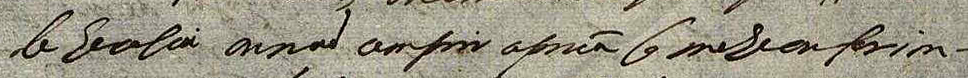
de heresia ou naõ comprir a pniā q̄ me he ou for im
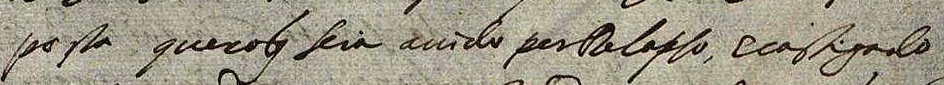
posta quero q̄ seia auido por Relapso, e castigado
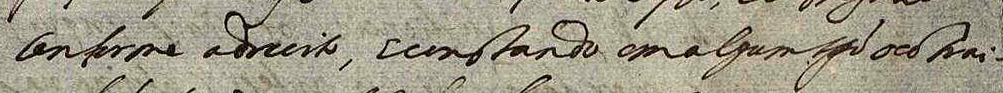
conforme a direito, E constando em algum tpō o cōtrai
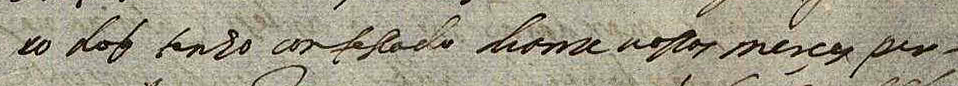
ro do q̄ tenho confessado diante uossas merces per
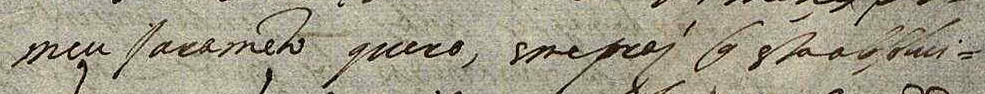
meu Juramēto quero, E me praz q̄ esta ao absolui
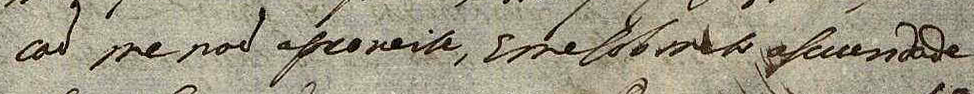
çaõ me naõ aproueite, E me sobmeto a seueridade
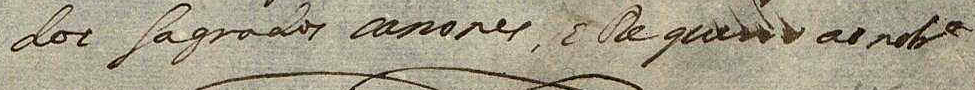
dos sagrados canones, E Requerio ao notro
